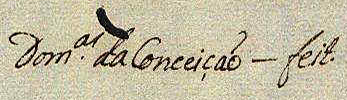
Dom.as da Conceiçaõ = feit.
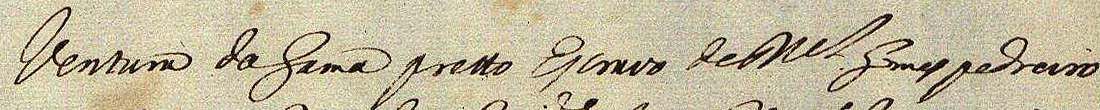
Ventura da Gama pretto Escravo de M.el Gomes pedreiro
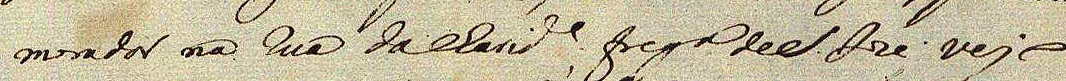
morador na Rua da charid.e freg.a de S. Iozé vejo
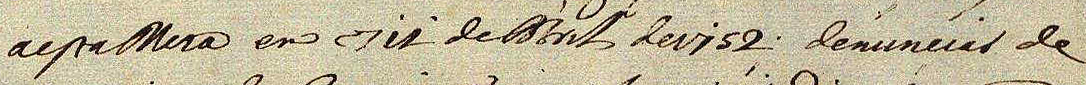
a esta Meza em os ii de Abril de i752. denuncias de
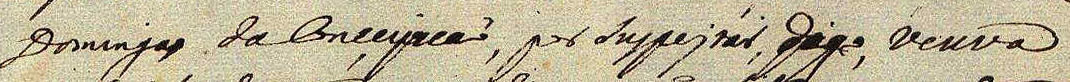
Domingas da Conceycçaõ, por suspejtar, digo veuva
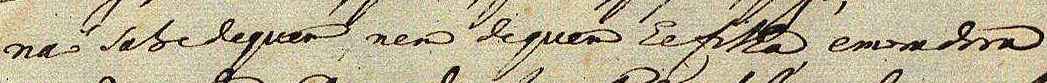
naõ sabe de quem nem de quem he filha, e moradora
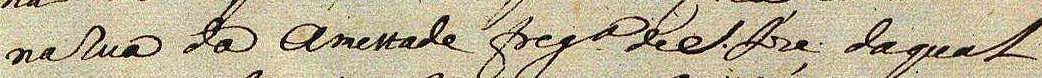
na Rua da Amettade freg.a de S. Joze; da qual
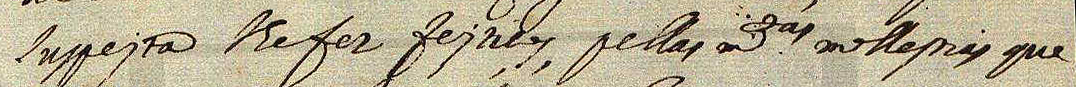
suspejta lhe fez fejtiços, pellas m.tas mollestias que
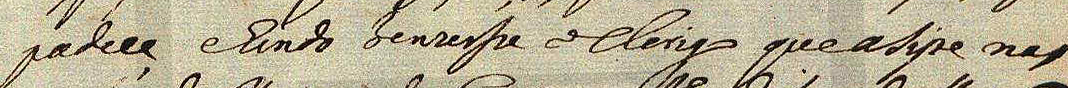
padeçe, e hindo benzersse o clerigo que asiste nas
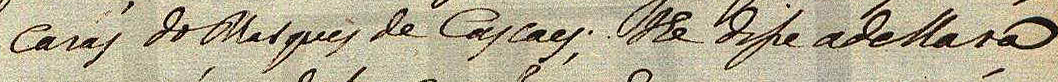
cazas do Marques de Cascaes; lhe disse a dellata
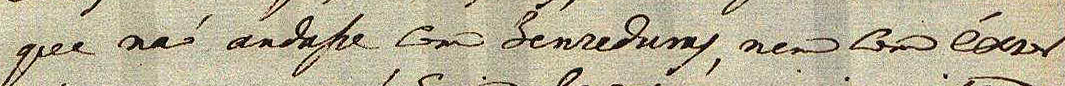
que naõ andasse com benzeduras, nem com exzer
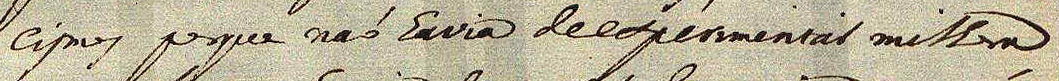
cissios, porque naõ havia de experimentar melhora
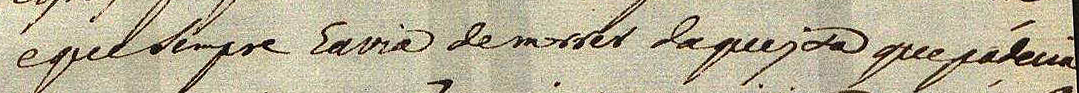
e que sempre havia de morrer da quejxa que padeçia
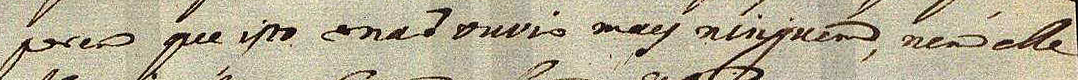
porem que isto o naõ ouvio maes ninguem, nem elle
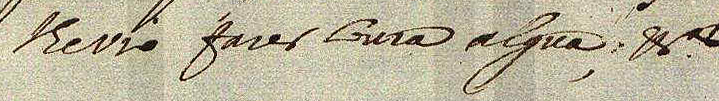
lhe vio fazer Couza alguā, &.a
